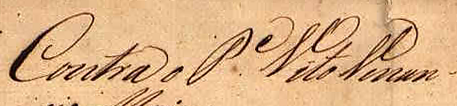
Contra o P.e Vito Venan
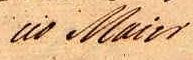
cio Maier
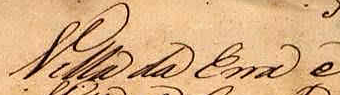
Villa da Erra, e
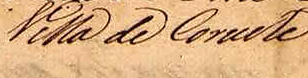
Villa de Coruche
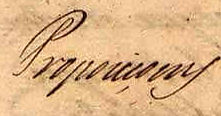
Proposiçoens
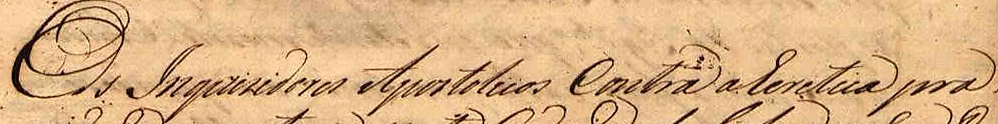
Os Inquisidores Apostolicos Contra a heretica pra
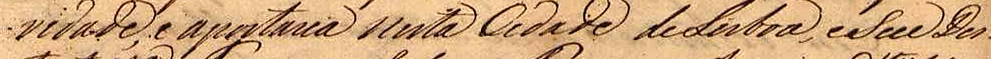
vidade, e apostasia nesta Cidade de Lisboa, e seu Des
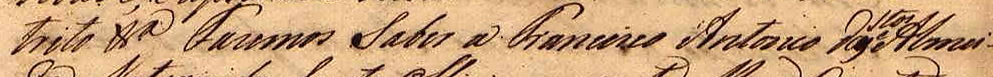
trito &a Fazemos Saber a Francisco Antonio dos s.tos Almei
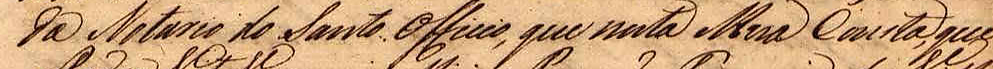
da Notario do Santo Officio, que nesta Meza Consta, que
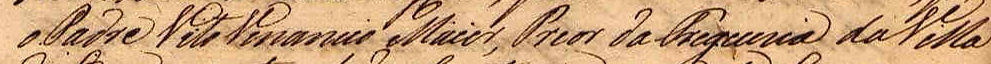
o Padre Vito Venancio Maier, Preor da Freguezia da Villa
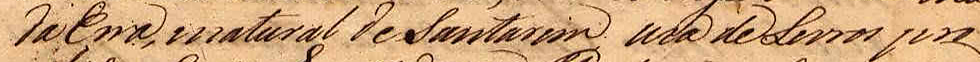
da Erra, e natural de Santarem; uza de Livros pro
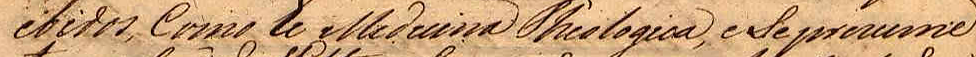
ibidos, Como he Medecina Theologica, e Se prezume
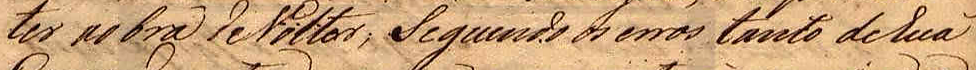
ter a obra de Volter; Seguindo os erros tanto de huā
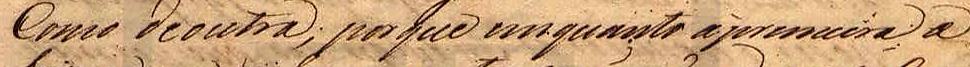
Como de outra; porque emquanto a premeira, a
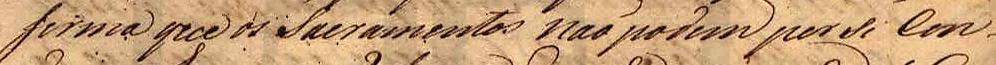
firma que os Sacramentos naõ podem per si con
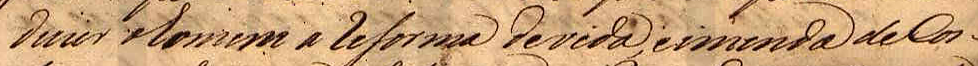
duzir o homem a Reforma de vida, e imenda de Cos
